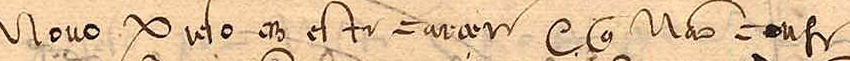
Nouo preso em este carçere e q̅ Naõ conhe
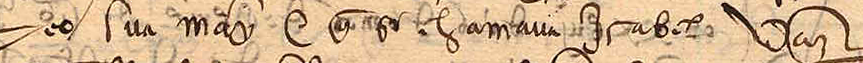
ceo sua may̅ e q̅ se chamaua Jsabel Vaz
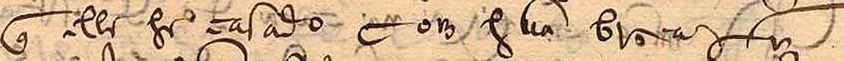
e q̅ elle he casado com hu̅a breatiz
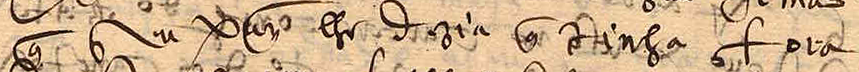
q̅ seu pay lhe dezia q̅ tinha fora
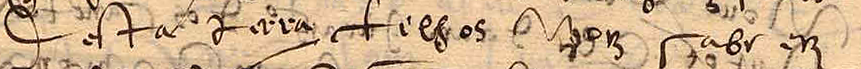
desta terra filhos nom sabe em
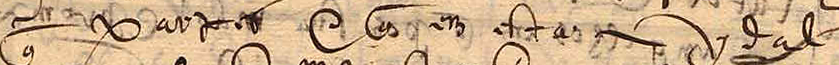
q̅ partes e q̅ em esta cydade
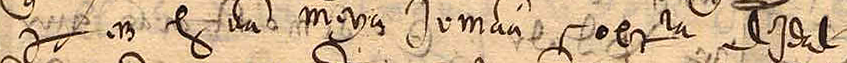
tem hu̅a meya Jrmaã soltra de Jdade
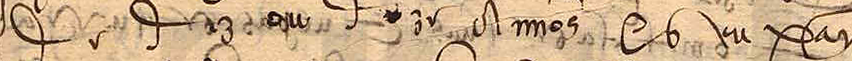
de dez ou doze Anno̅s e seu pay
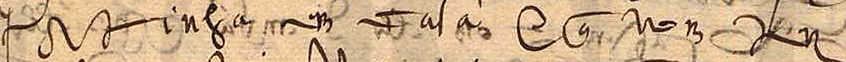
A tinha em casa e q̅ nom ten
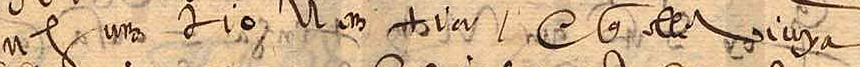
nehum tio nem tia / e q̅ ella viuya
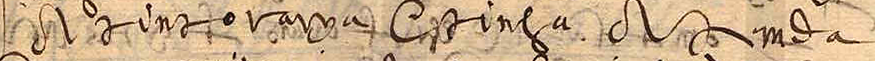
A tintorarya e tinha A temda
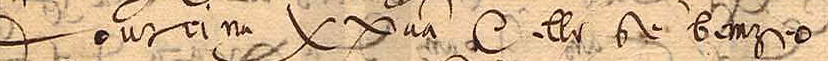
doutrina Xpaã e elle se bemzeo
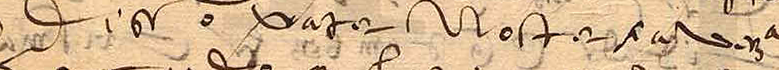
e dise o pater Noster a ave ma
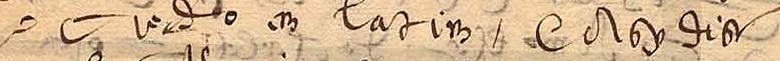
e o credo em latim / e Asy dise
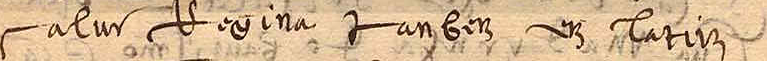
A salue Regina tanbem em latim
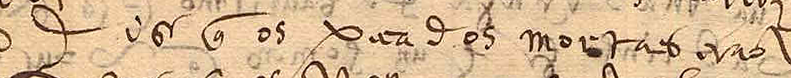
e dise q̅ os pecados mortaes eraõ
